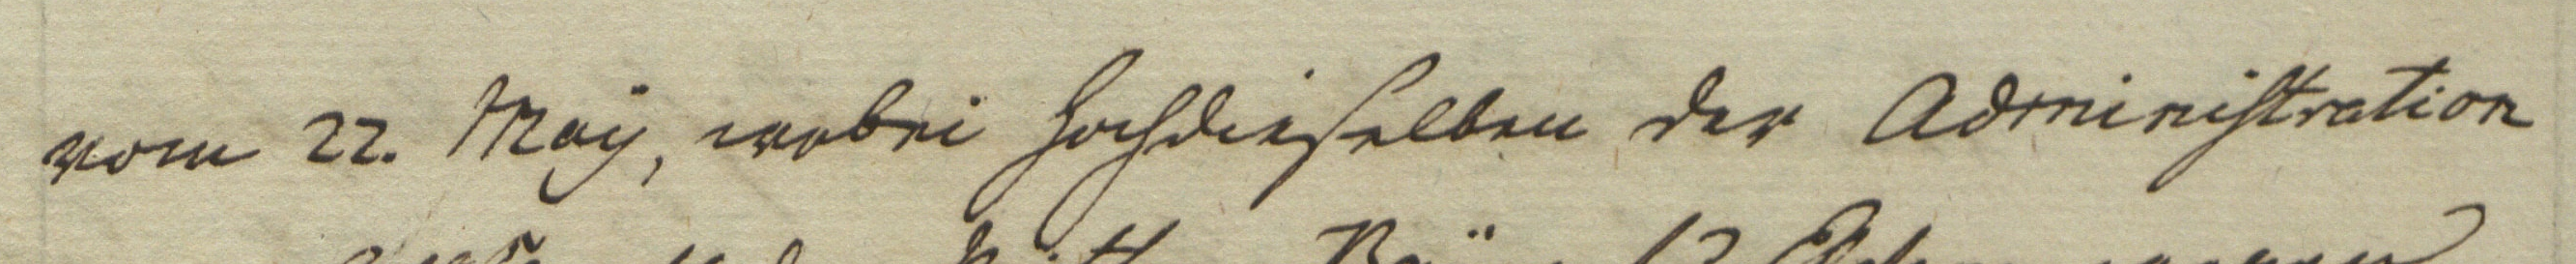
vom 22. May, wobei hochdieselben der Administration
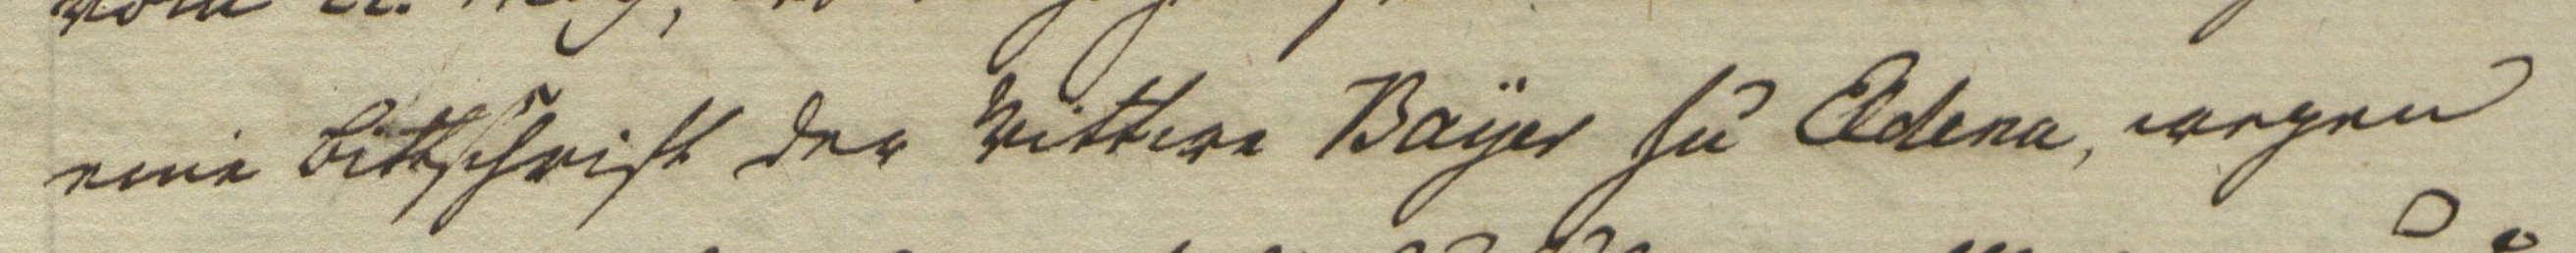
eine Bittschrift der Wittwe Bayer zu Eldena, wegen
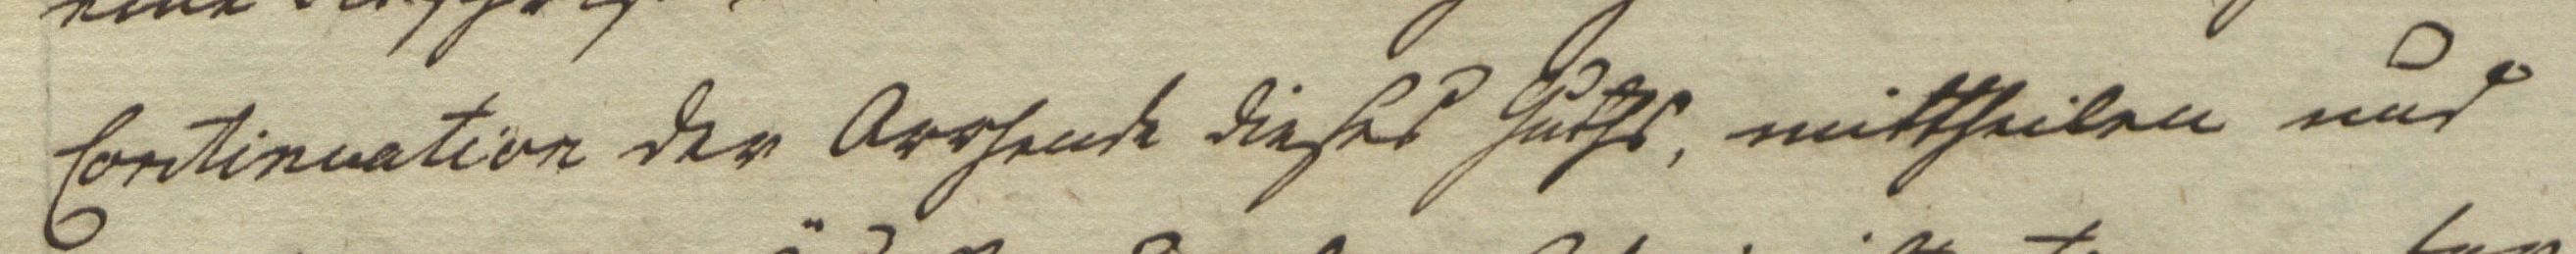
Continuation der Arrhende dieses Guths, mittheilen und
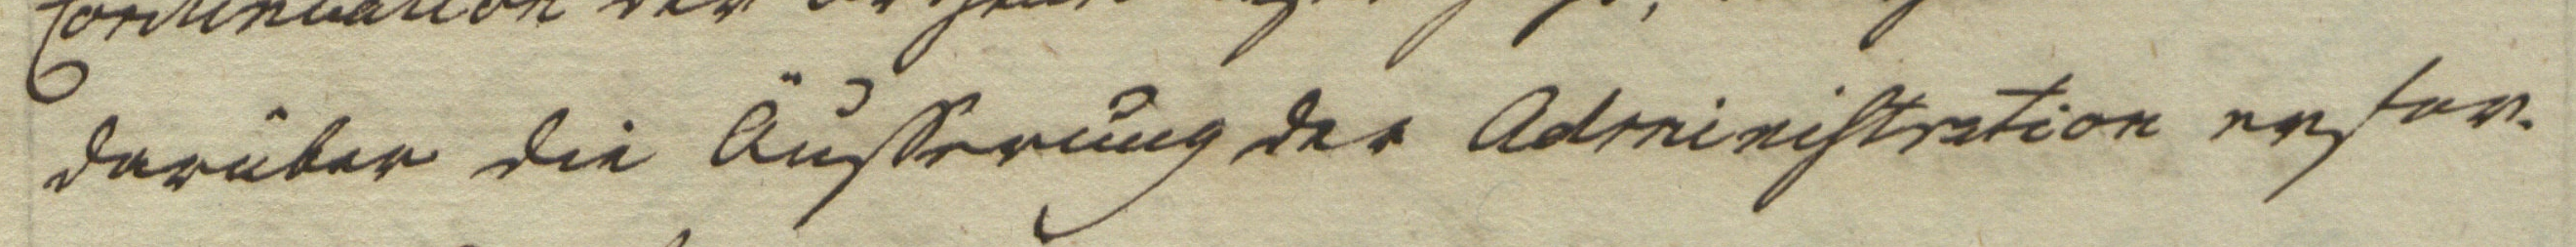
darüber die Äusserung der Administration erfor¬
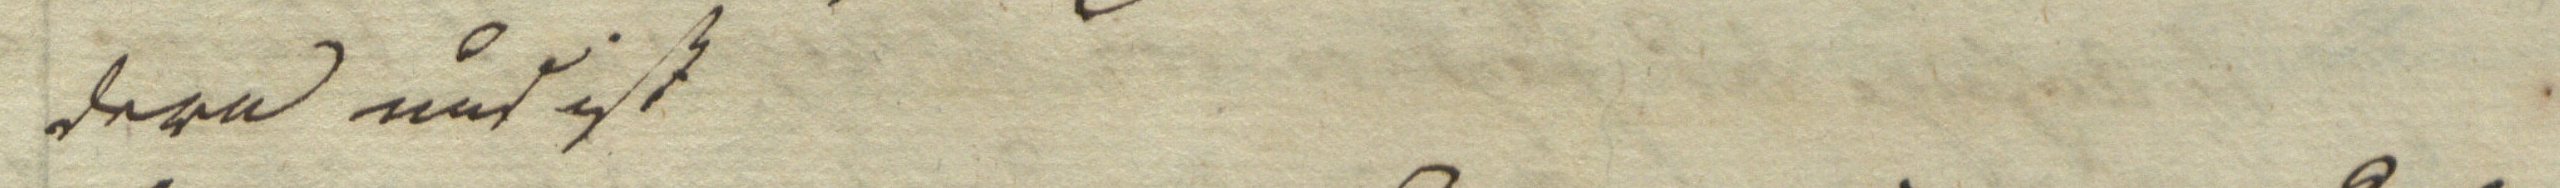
dern und ist
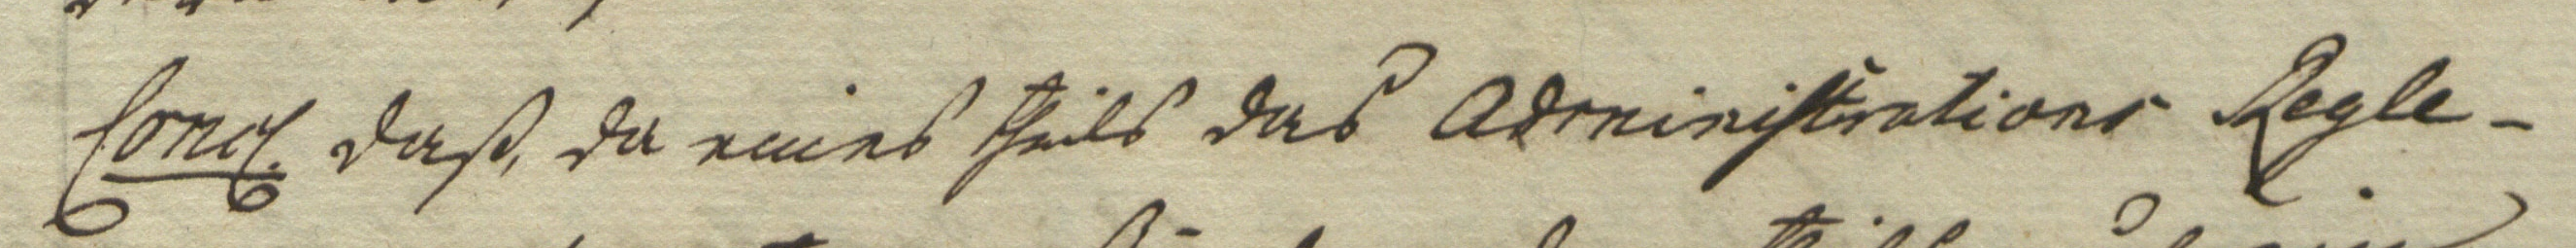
Concl. daß, da eines theils das Administraions Regle¬
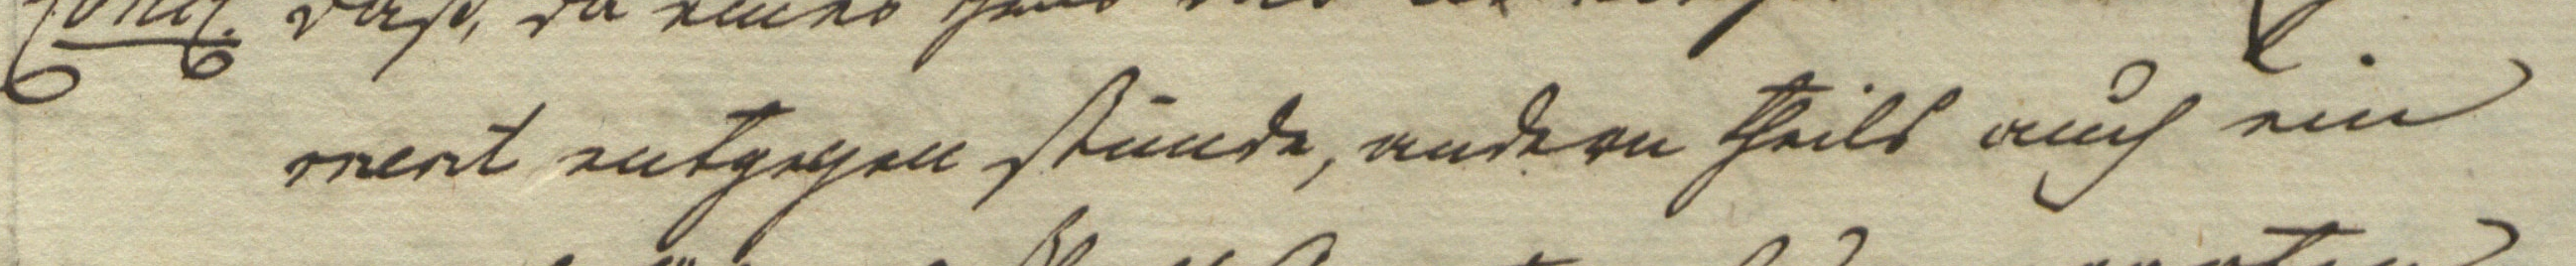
ment entgegen stünde, andern theils auch ein
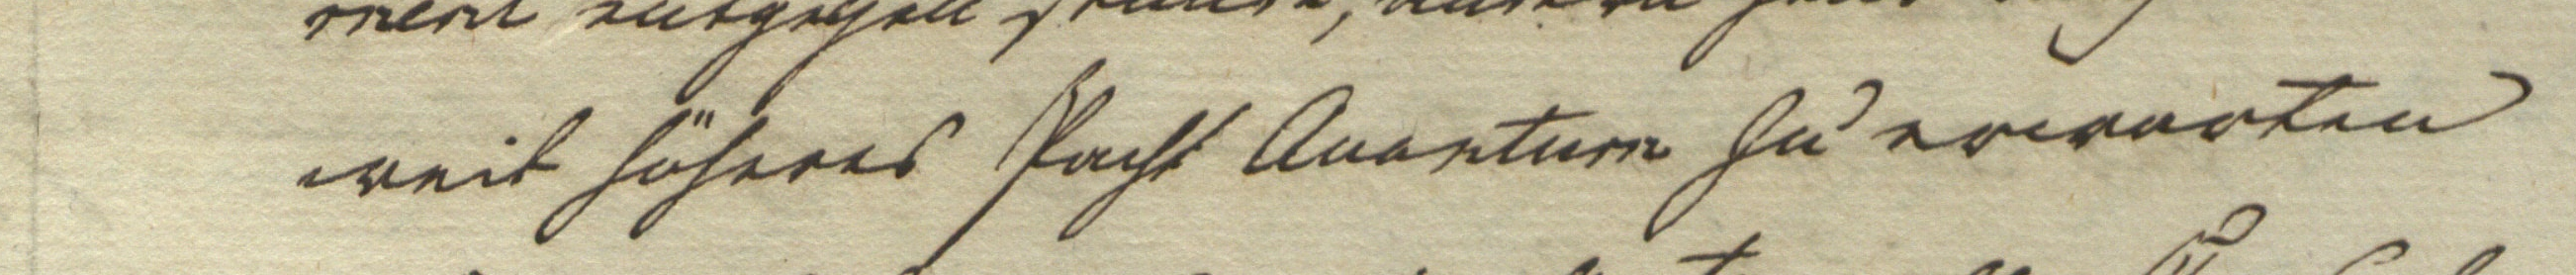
weit höheres Pacht Quantum zu erwarten
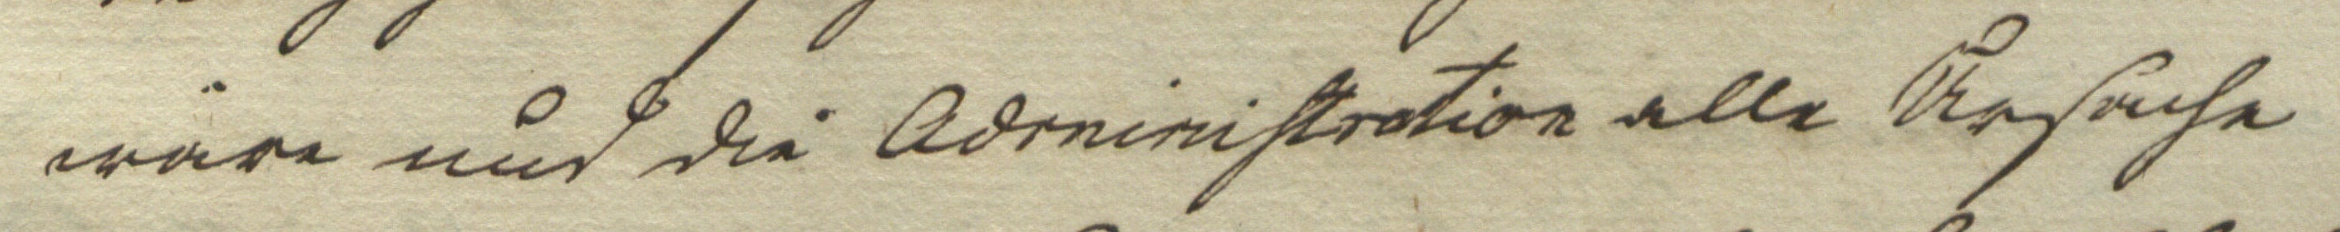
wäre und die Administration alle Ursache
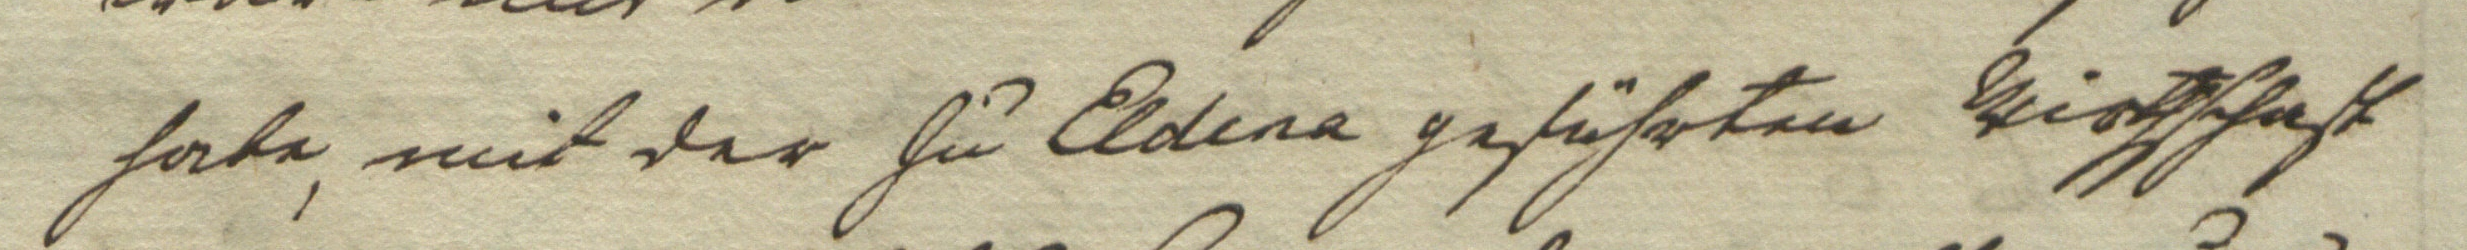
habe, mit der zu Eldena geführten Wirthschaft
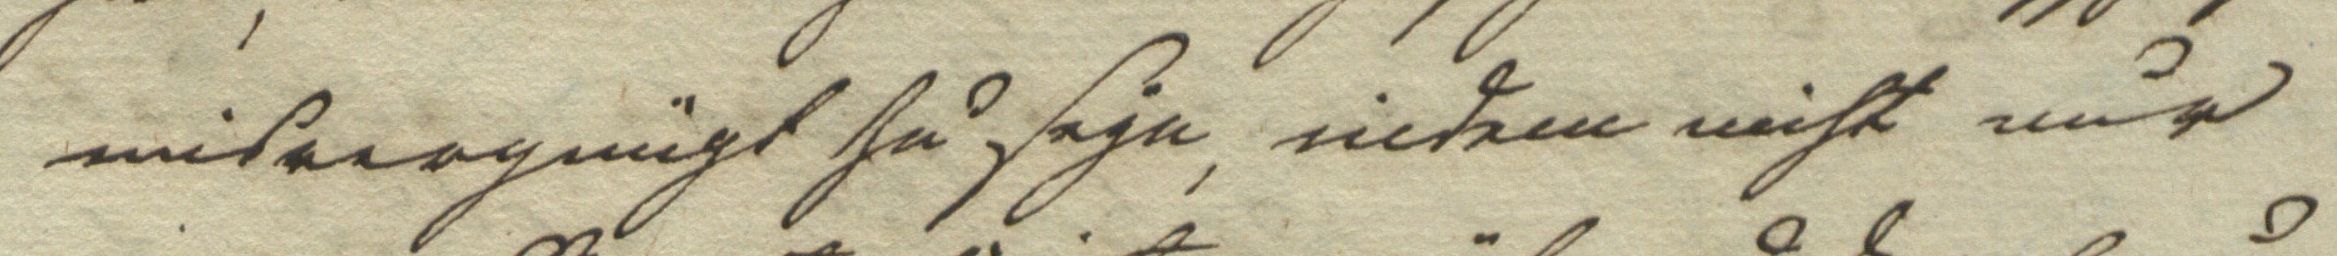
misvergnügt zu seyn, indem nicht nur
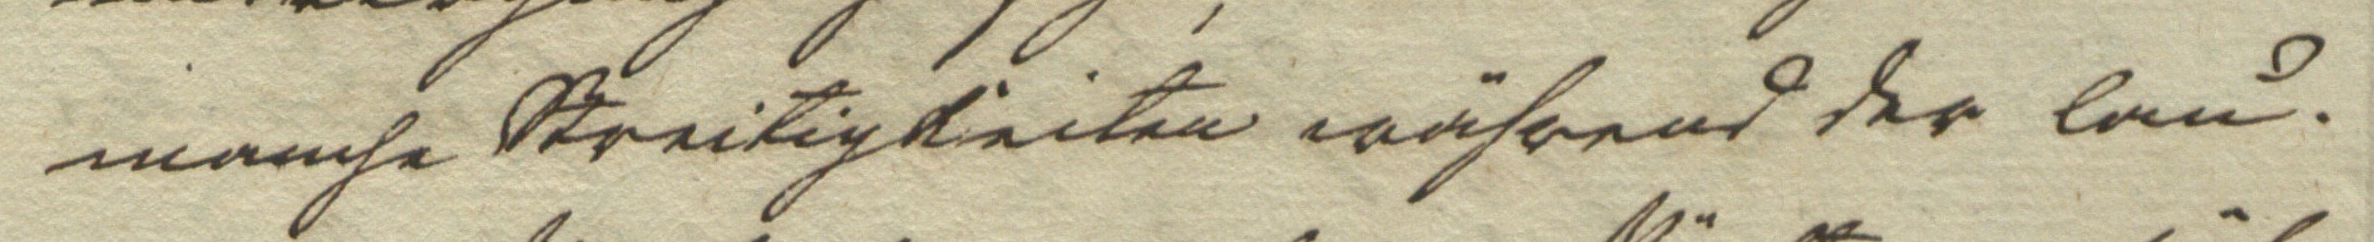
manche Streitigkeiten während der lau¬¬
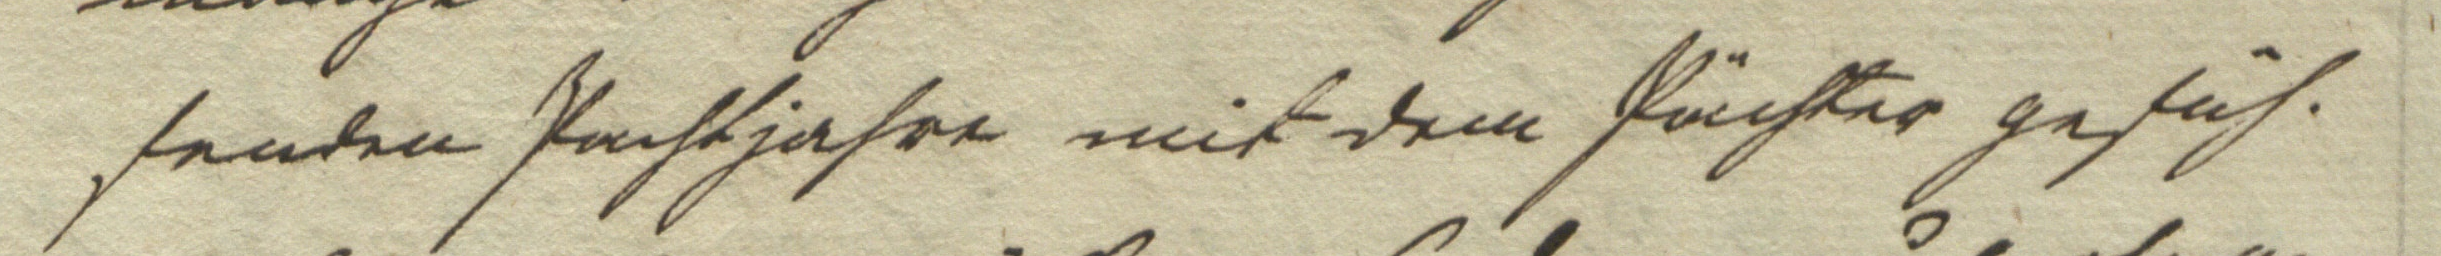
fenden Pachtjahre mit dem Pächter gefüh¬
